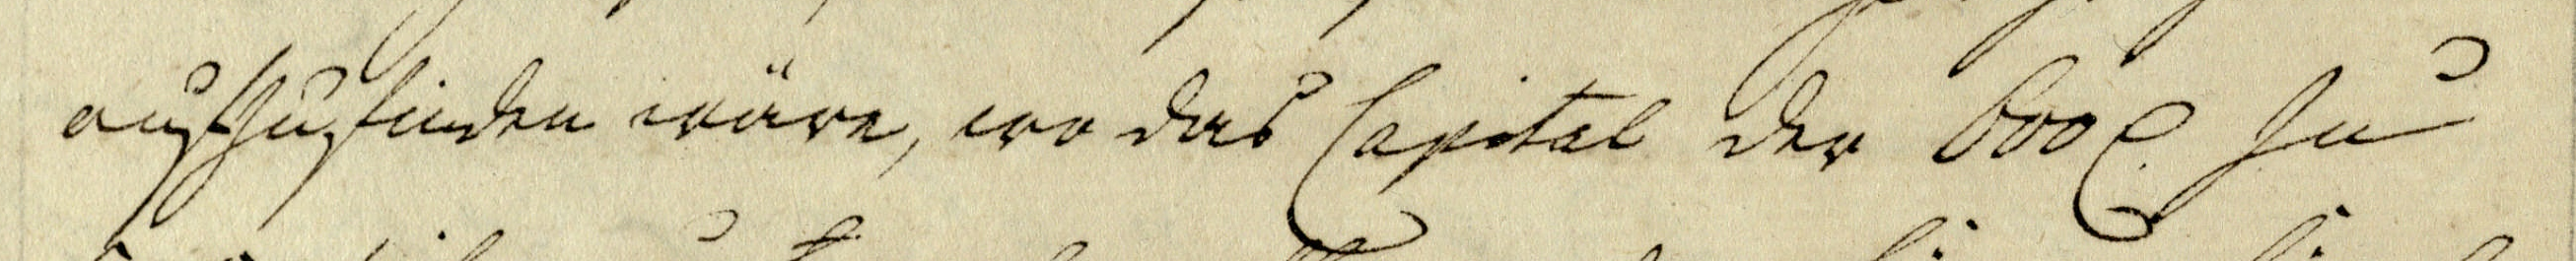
aufzufiden wäre, wo das Capital der 600 l. zu
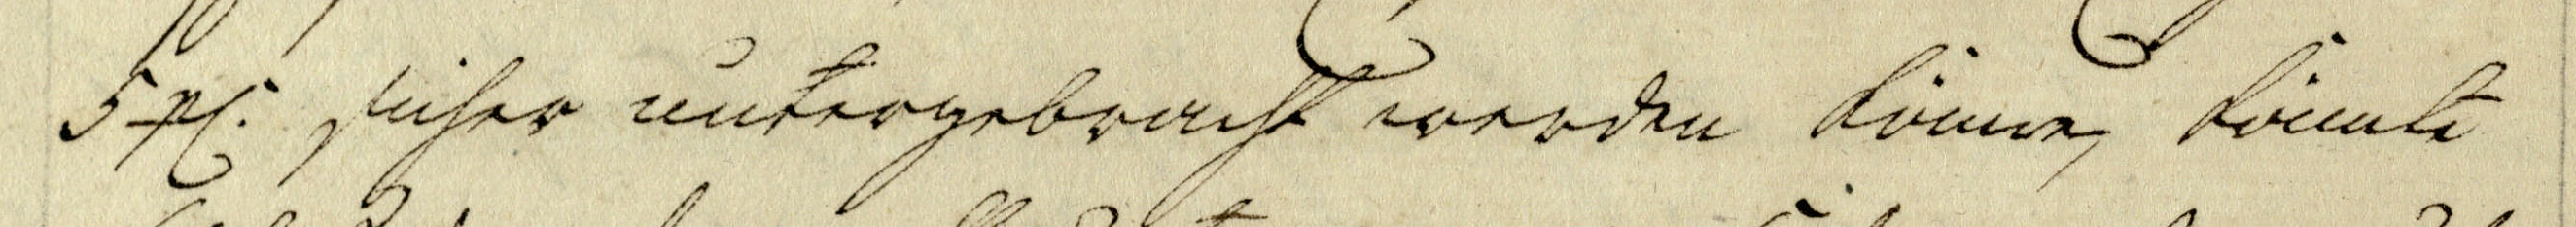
5 pl. sicher untergebracht werden könne, könnte
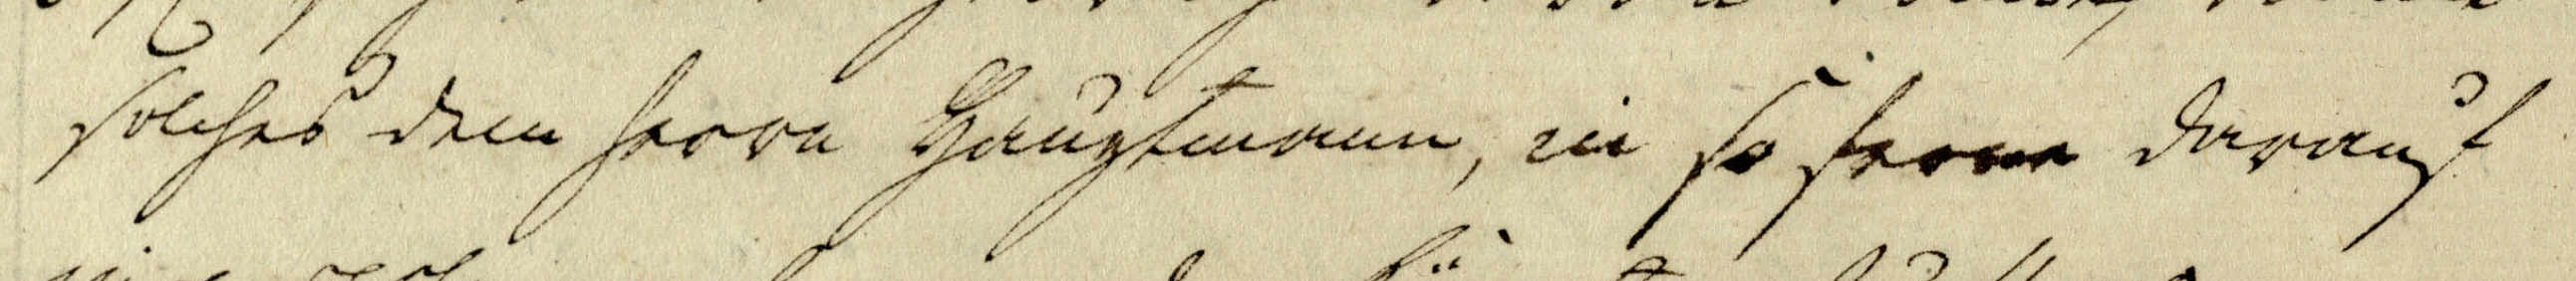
solches dem Herrn Hauptmann, in so ferne darauf
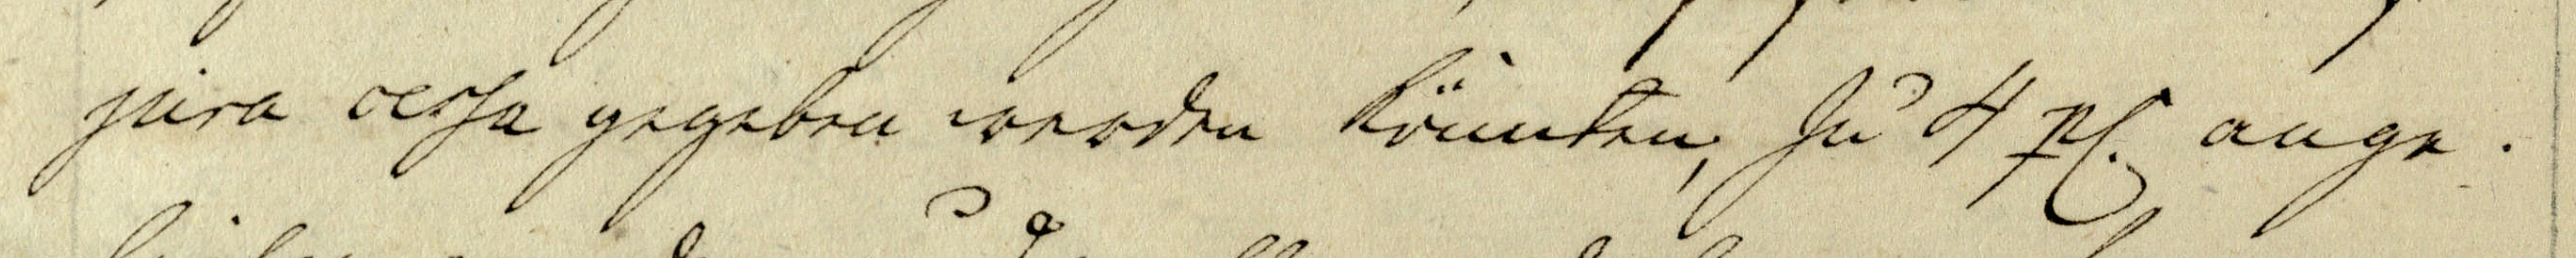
jura cessa gegeben werden könnten, zu 4 pl. ange¬
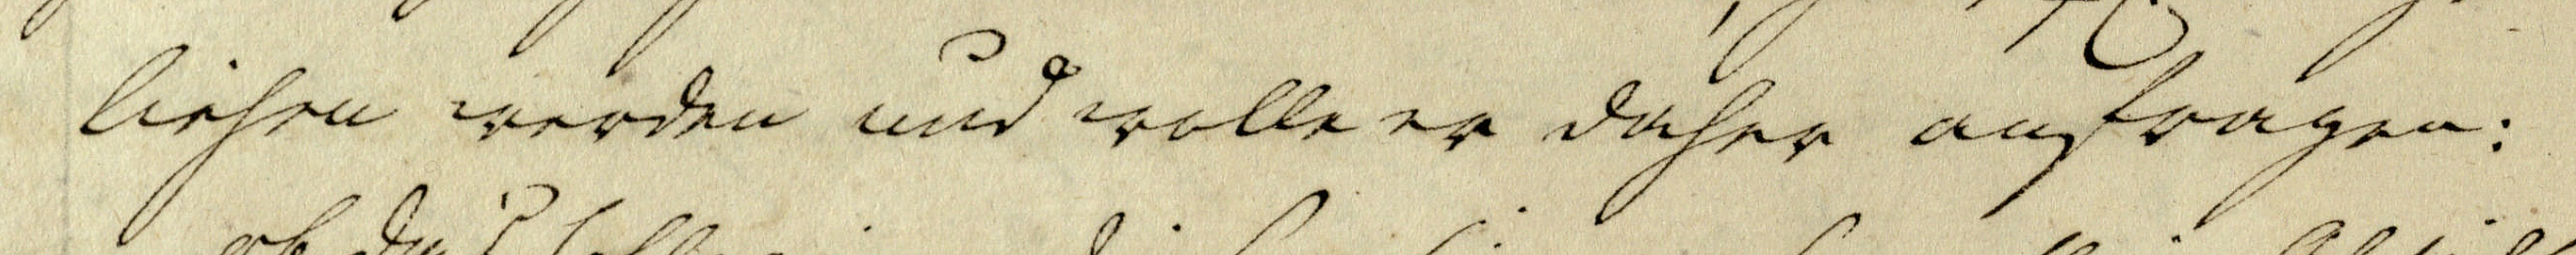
liehen werden und wolle er daher anfragen:
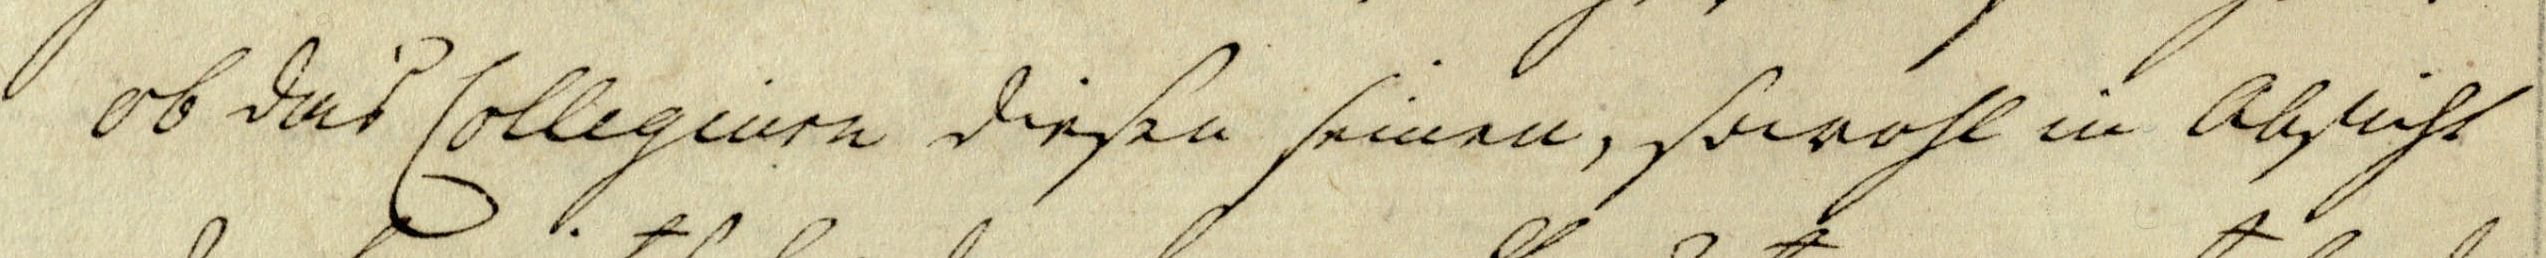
ob das Collegium diesen seinen, sowohl in Absicht
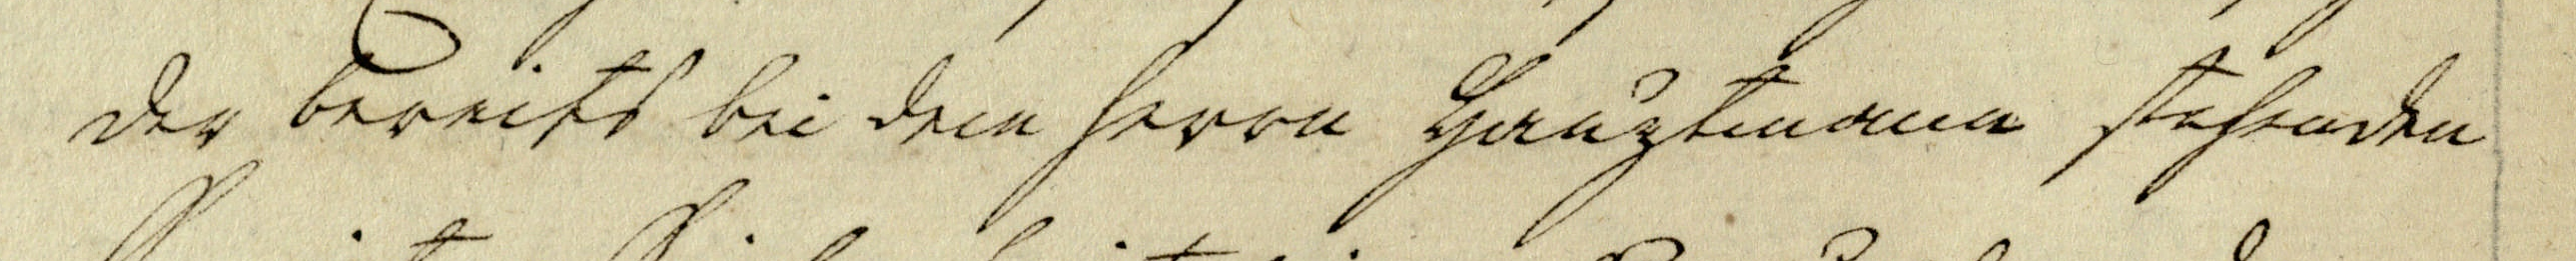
der bereits bei dem Herrn Hauptmann stehenden
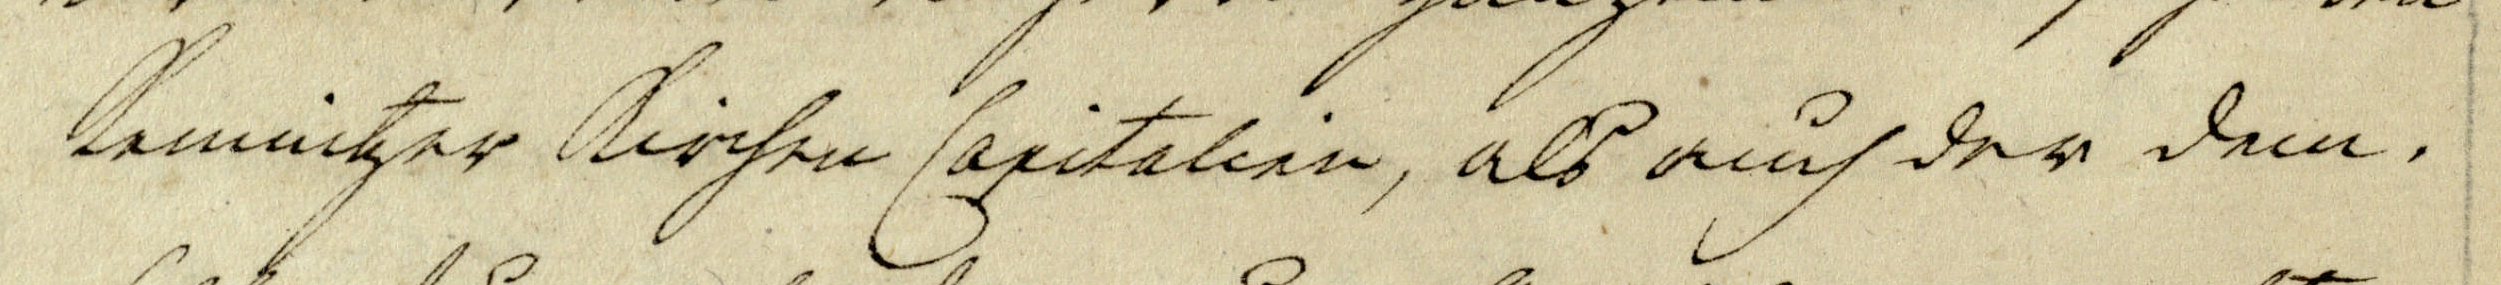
Kemnitzer Kirchen Capitalien, als auch der dem¬
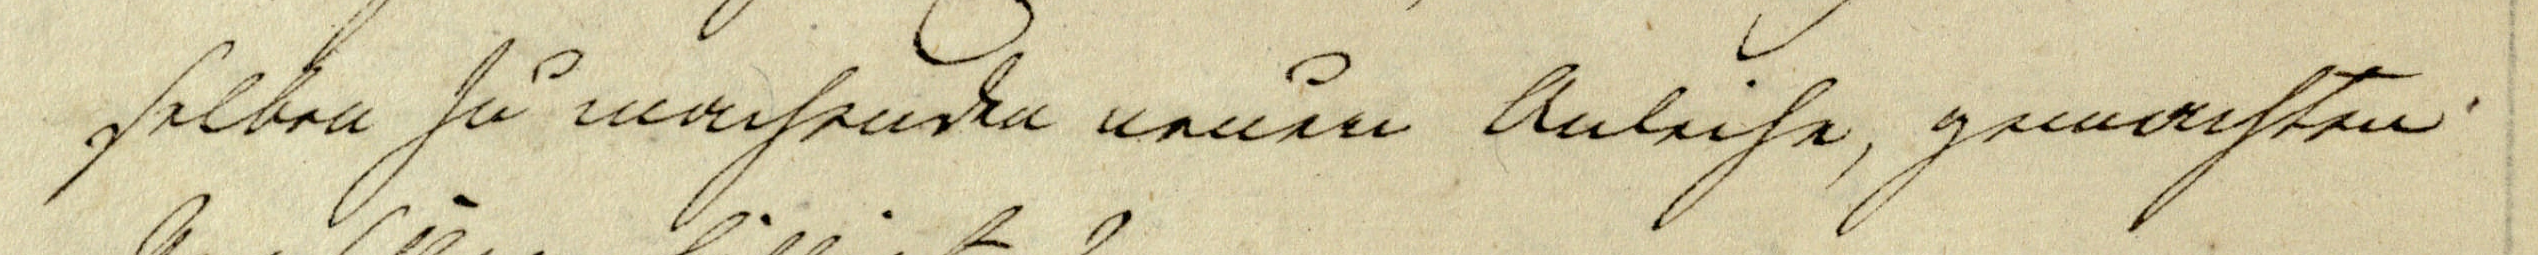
selben zu machenden neuen Anleihe, gemachten.
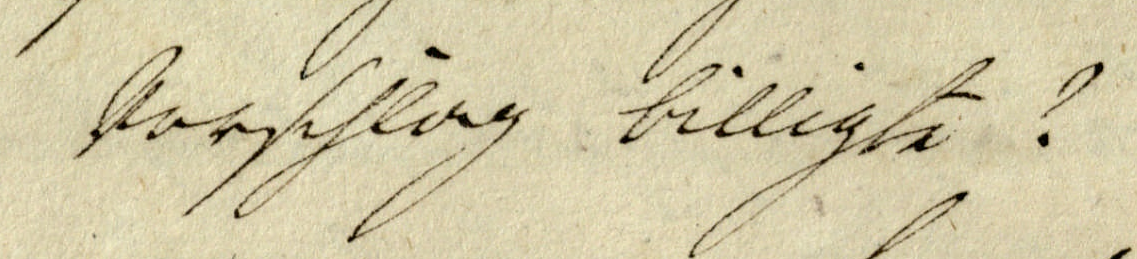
Vorschlag billegte?
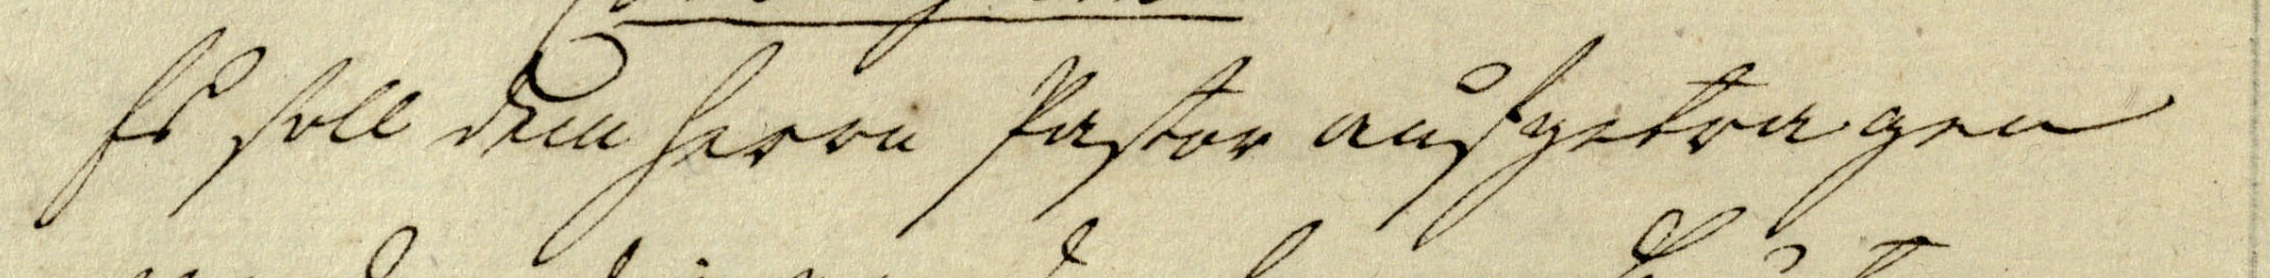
Es soll dem Herrn Pastor aufgetragen
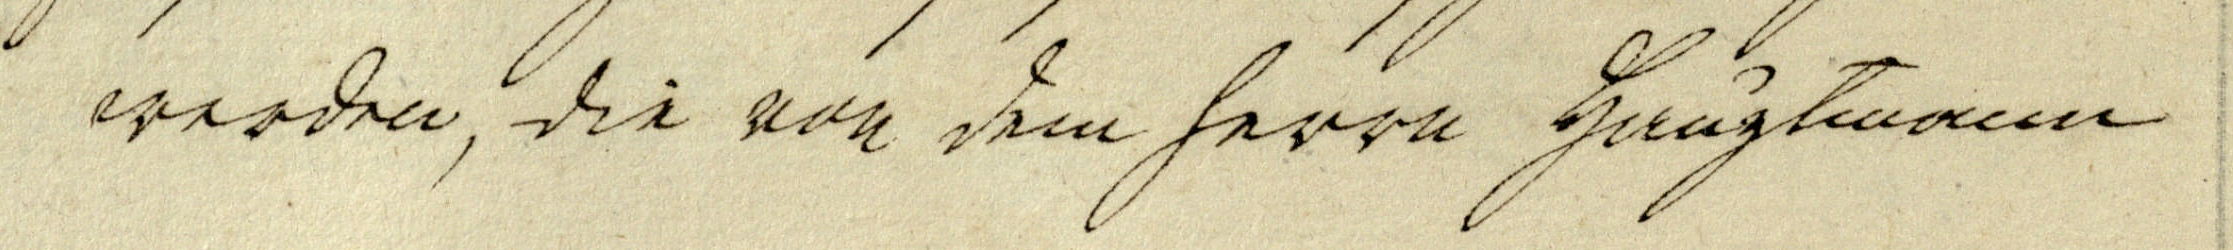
werden, die von dem Herrn Hauptmann
